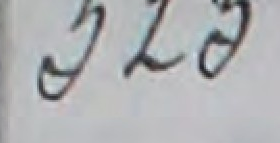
323
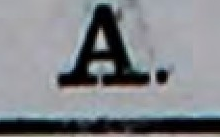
A.
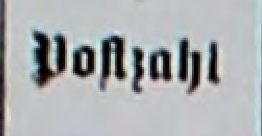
Postzahl
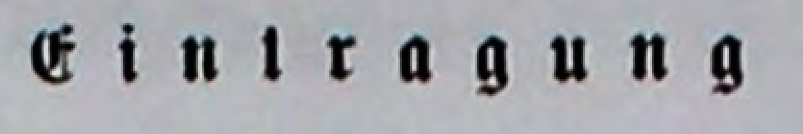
Eintragung
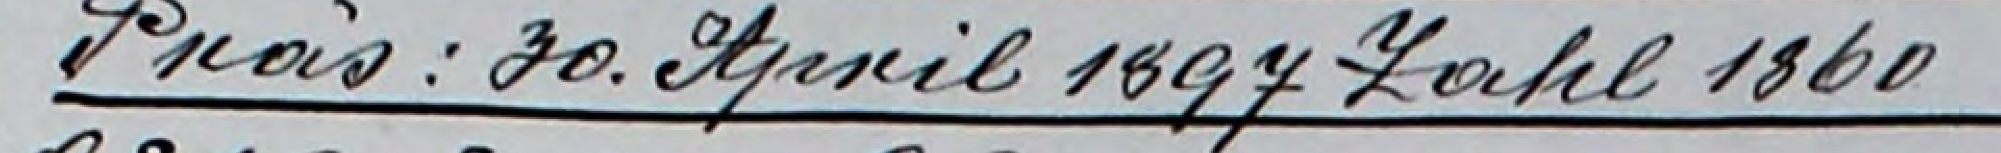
Präs: 30. April 1897 Zahl 1860
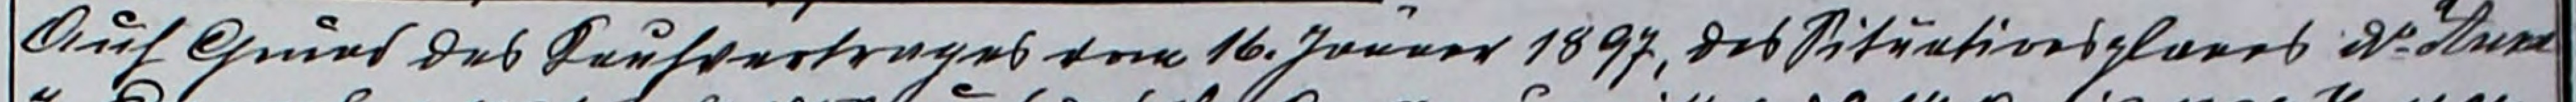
Auf Grund des Kaufvertrages vom 16. Jänner 1897, des Situationsplanes der Anna
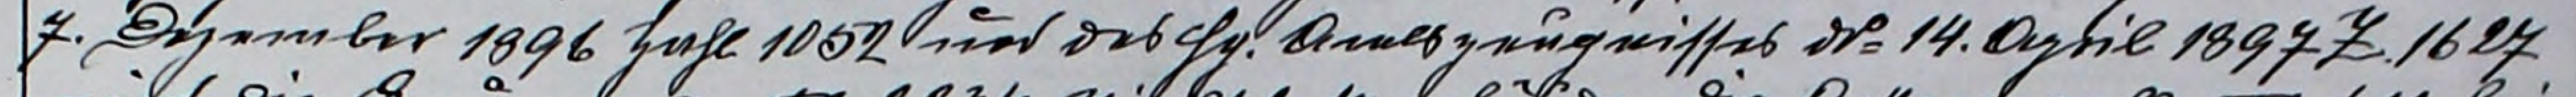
7. Dezember 1896 Zahl 1052 und des Hg. Amtszeugnisses der 14. April 1897 Z. 1627
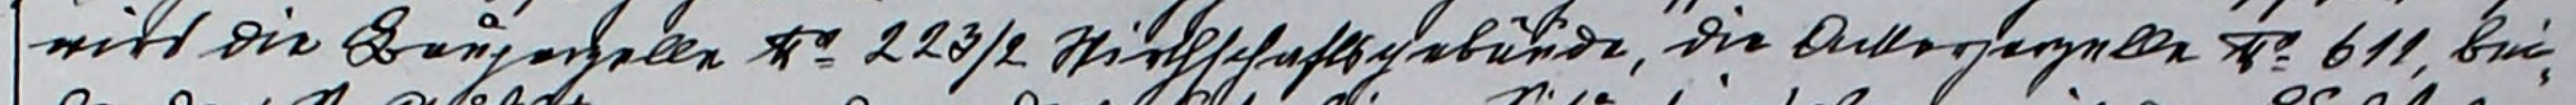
wird die Bauparzelle No 223/2 Wirthschaftsgebäude, die Ackerparzelle No 611, Bür„
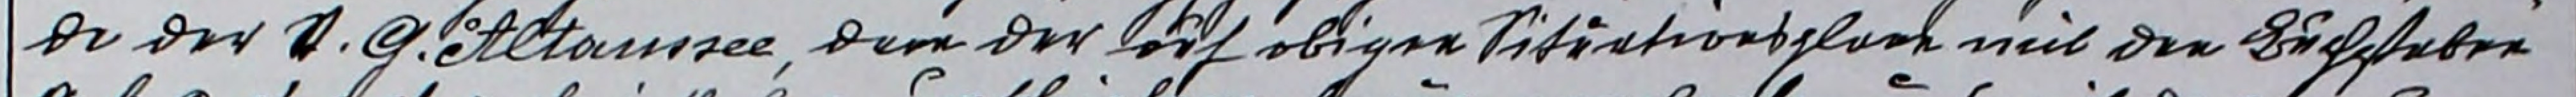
de der St.G. Altaussee, dann der auf obigen Situationsplane mit den Buchstaben
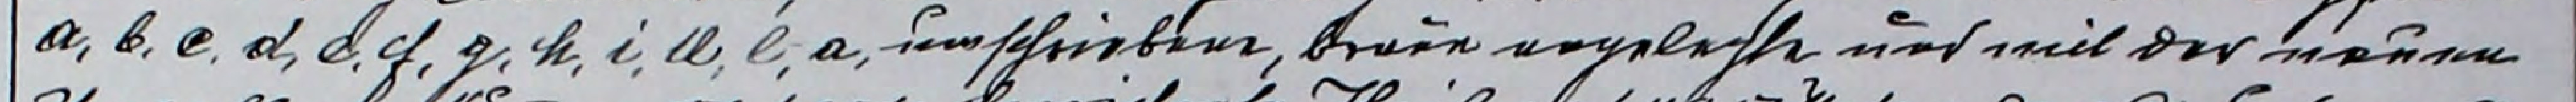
a, b, c, d, e, f, g, h, i , k, l, a, umschriebene, Brunne angelegte und mit der neuen
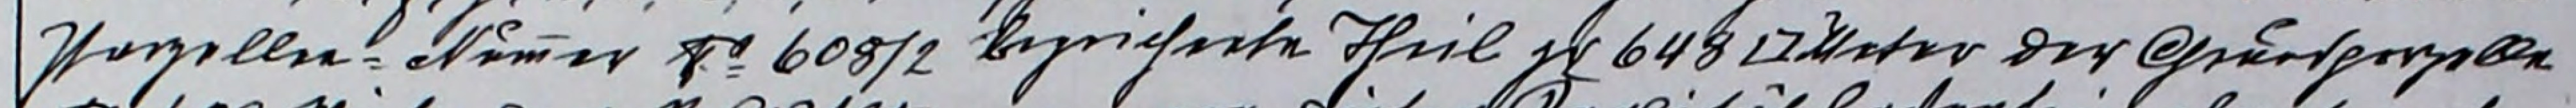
Parzellen = Nummer No 608/2 Bezeichnete Theil pr 648 Öketer der Grundparzelle
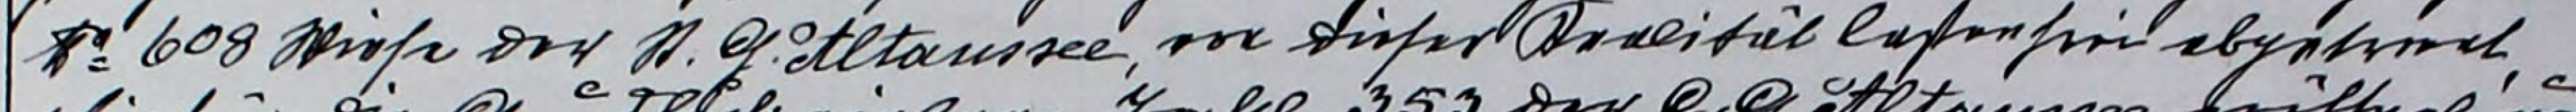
No 608 Wiese der St. G. Altaussee, von dieser Realität lastenfrei abgetrennt,
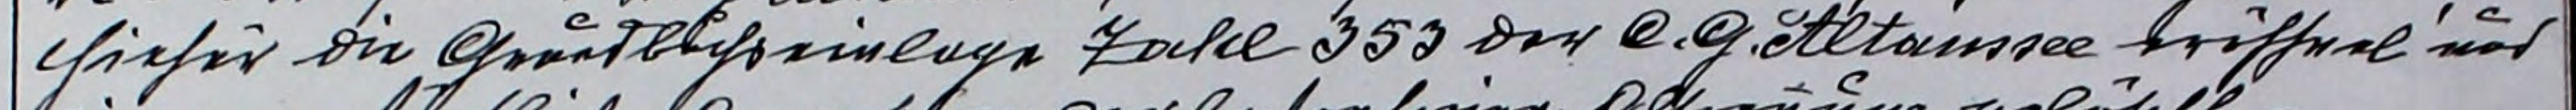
Hiefür die Grundbuchseinlage Zahl 353 der C.G. Altaussee eröffnet und
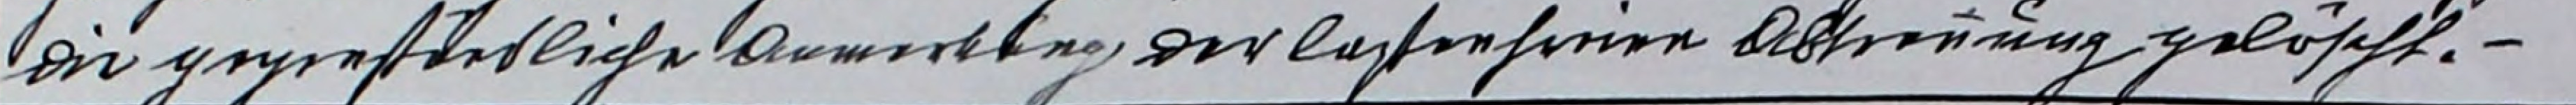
die gegenstürsliche Anmerkung der lastenfreien Abtrennung gelöscht. -
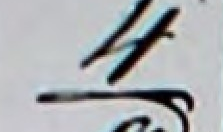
4
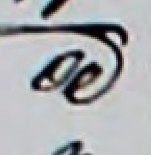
a
